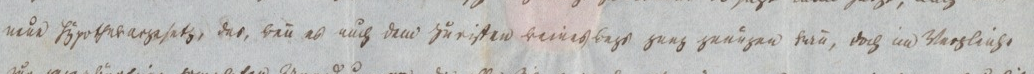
neue Hypothekargesetz, das, wenn es auch dem Juristen keineswegs ganz genügen kann, doch im Vergleiche
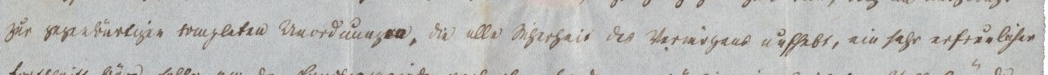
zur gegenwärtigen kompleten Unordnung, die alle Sicherheit des Vermögens aufhebt, ein sehr erfreulicher
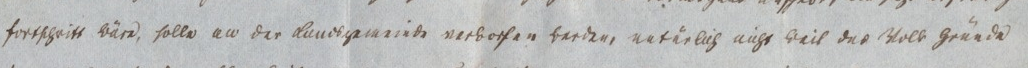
Fortschritt wäre, solle an der Landsgemeinde verworfen werden, natürlich nicht weil das Volk Gründe
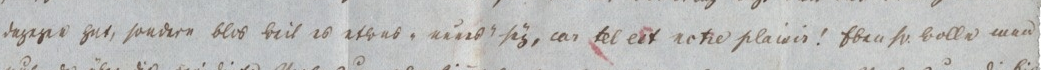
dagegen hat, sondern blos weil es etwas «neues» sey, car tel est notre plaisir! Eben so wolle man
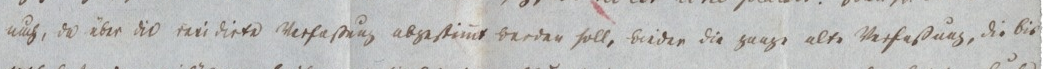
auch, da über die revidirte Verfassung abgestimmt werden soll, wieder die ganze alte Verfassung, die bis
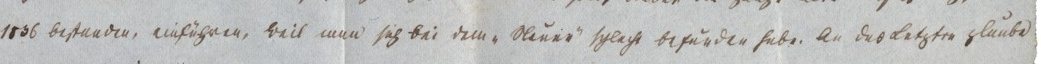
1836 bestanden, einführen, weil man sich bei dem «Neuen» schlecht befunden habe. An das Letztre glaube
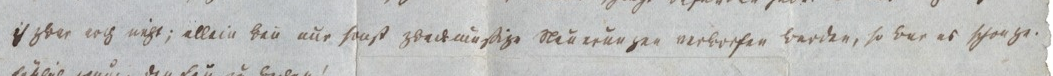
ich zwar noch nicht; allein wenn nur sonst zweckmäßige Neuerungen verworfen werden, so war es schon ge-
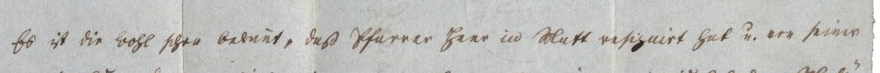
Es ist dir wohl schon bekannt, daß Pfarrer Heer in Matt resignirt hat u. von seiner
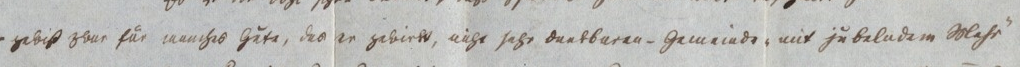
gewiß zwar für manches Gute, das er gewirkt, nicht sehr dankbaren – Gemeinde «mit jubelndem Mehr»
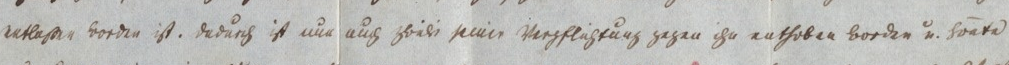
entlassen worden ist. Dadurch ist nun auch Zwicki seiner Verpflichtung gegen ihn enthoben worden u. konnte
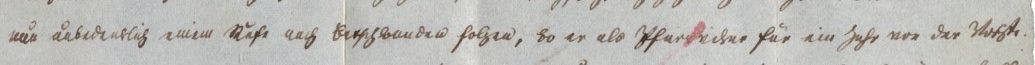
nun unbedenklich einem Rufe nach Betschwanden folgen, wo er als Pfarrvikar für ein Jahr von der Vorste-
